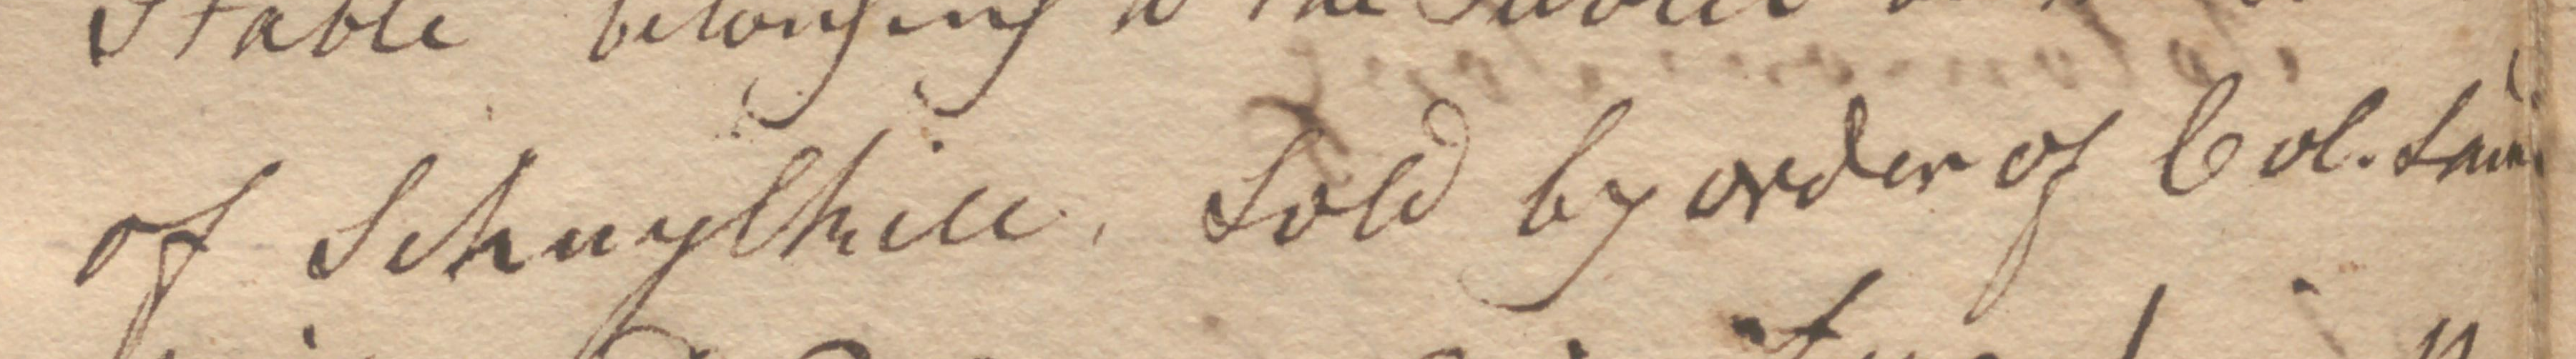of Schuylkill. sold by order of Col. Law
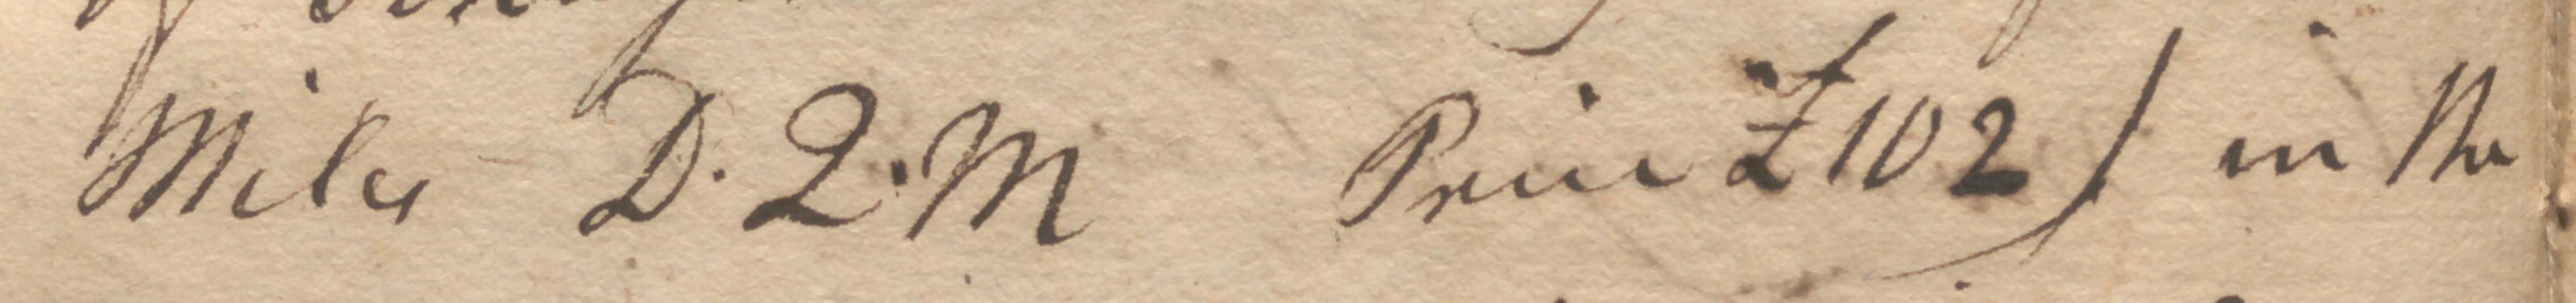Miles D.Q.M Price £102 ) in the
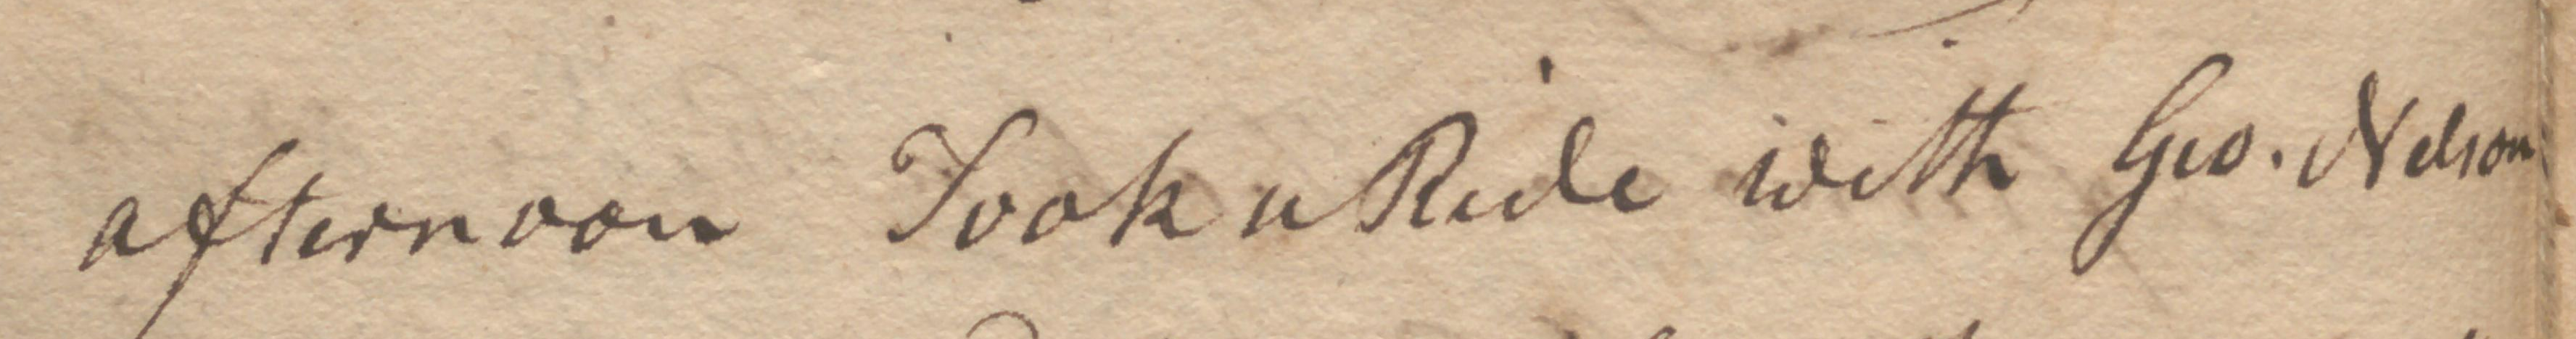afternoon Took a Ride with Geo. Nelson
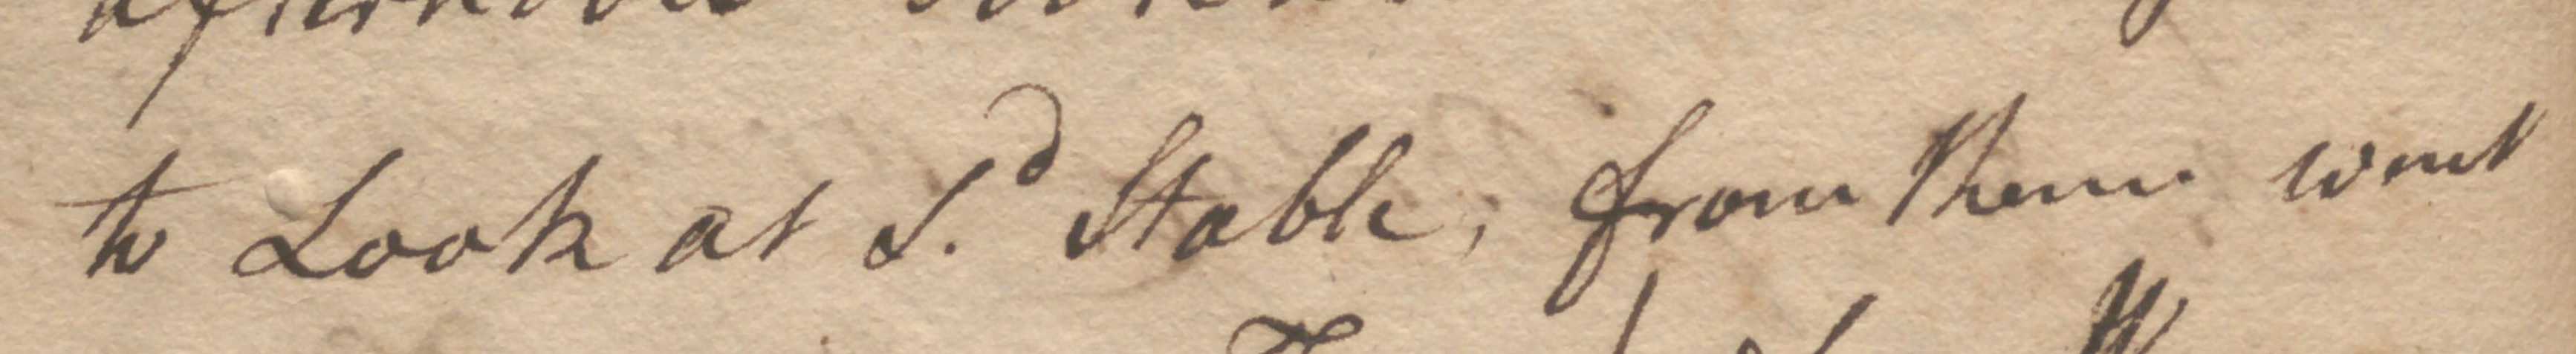to Look at s^d. Stable, from thence went
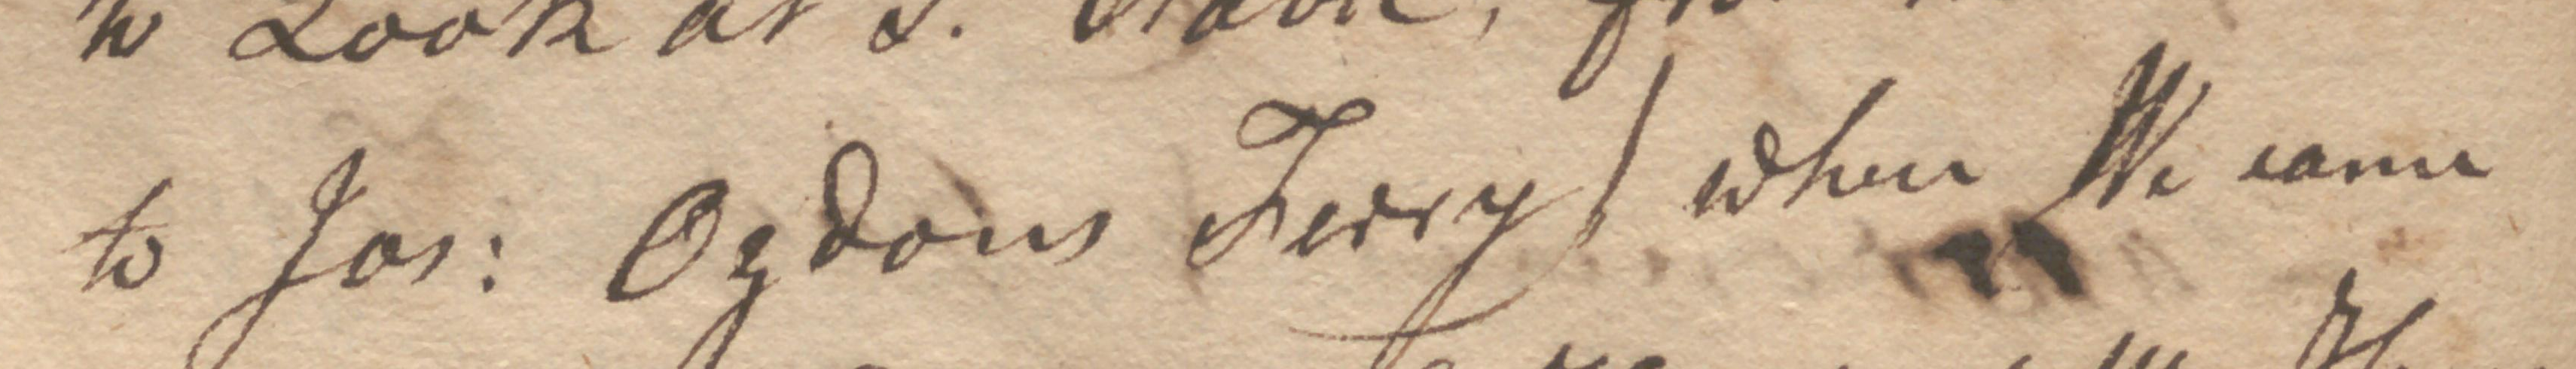to Jos: Ogdons Ferry) when We came
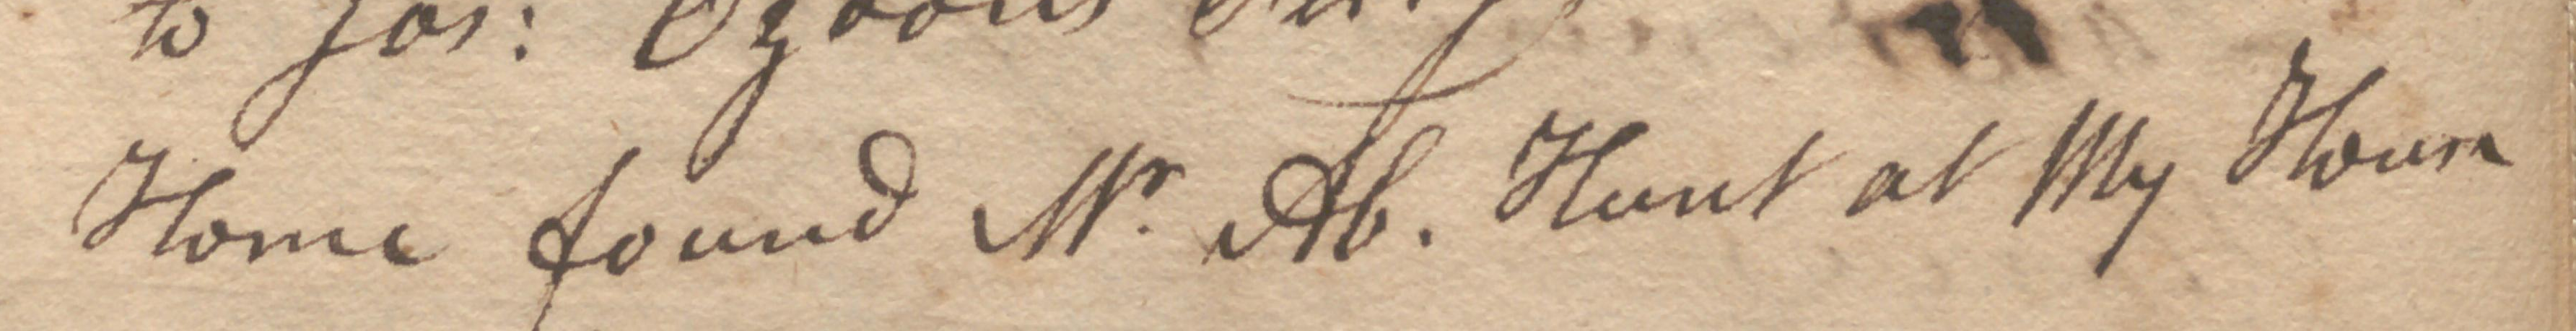Home found M^r. Ab. Hunt at My House
